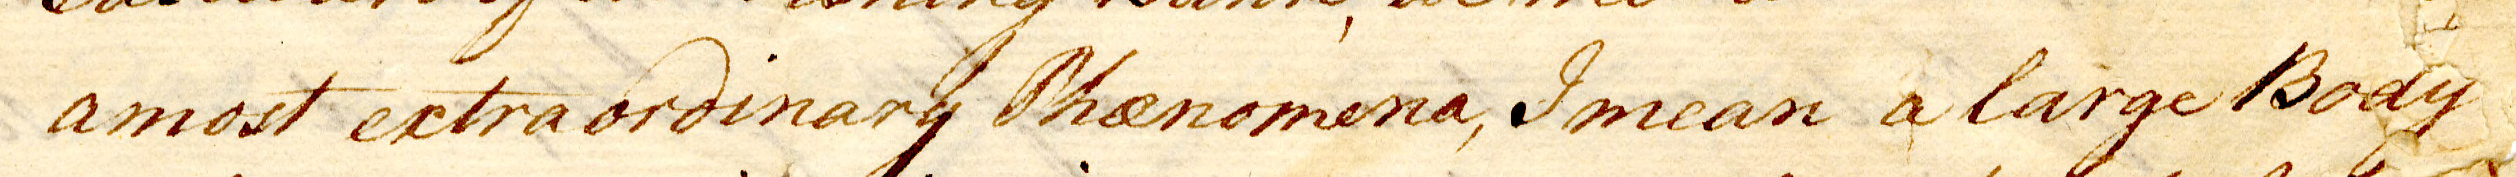a most extraordinary Phenomena, I mean a large Body
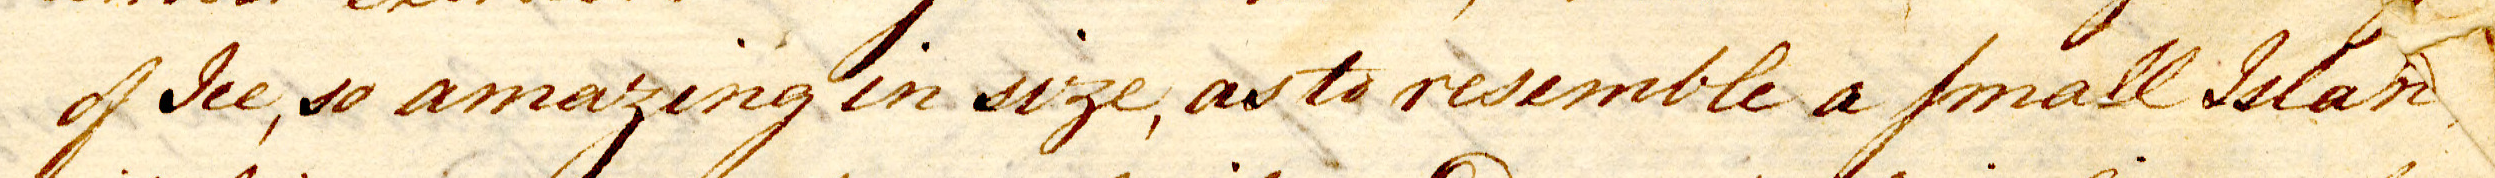of Ice, so amazing in size, as to resemble a small Islan
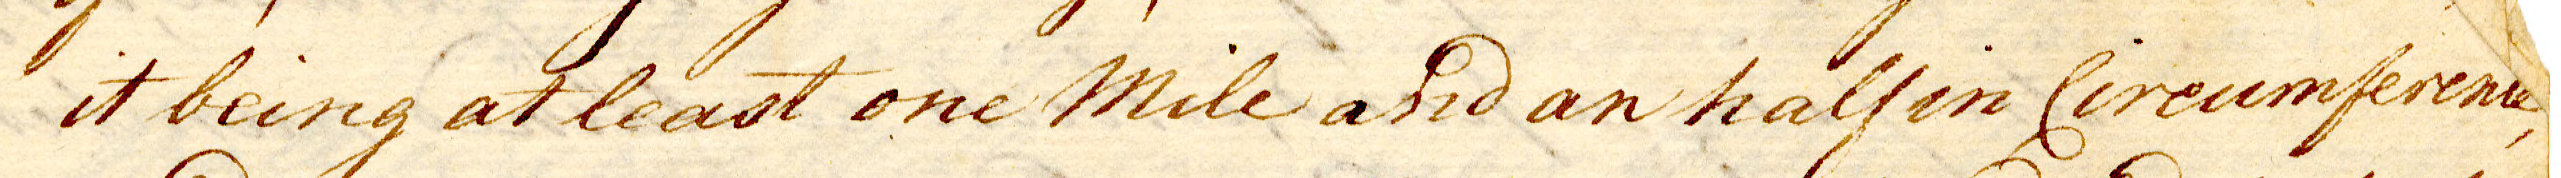it being at least one Mile and an half in Circumference,
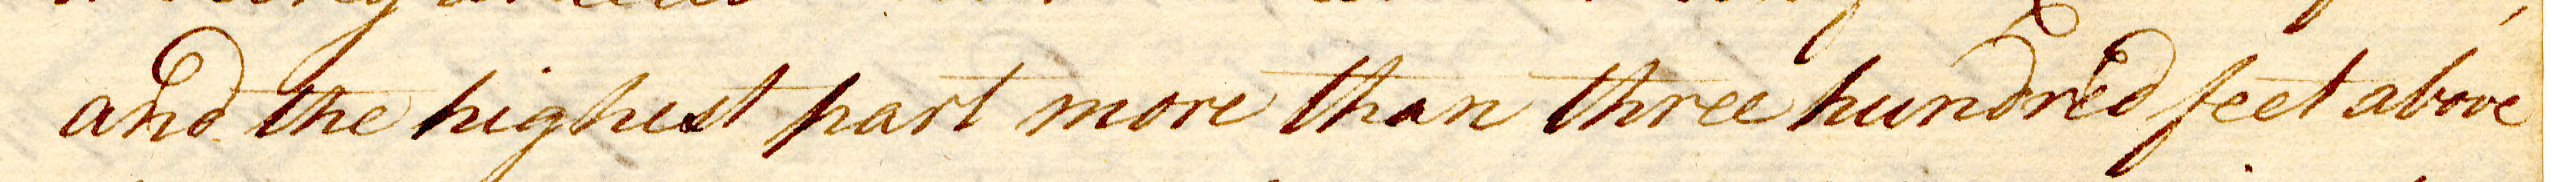and the highest part more than three hundred feet above
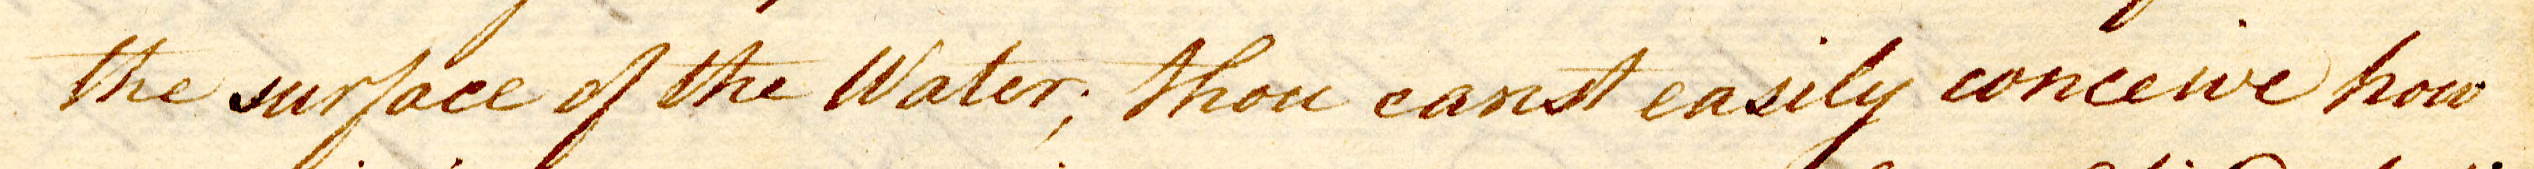the surface of the Water; thou canst easily conceive how
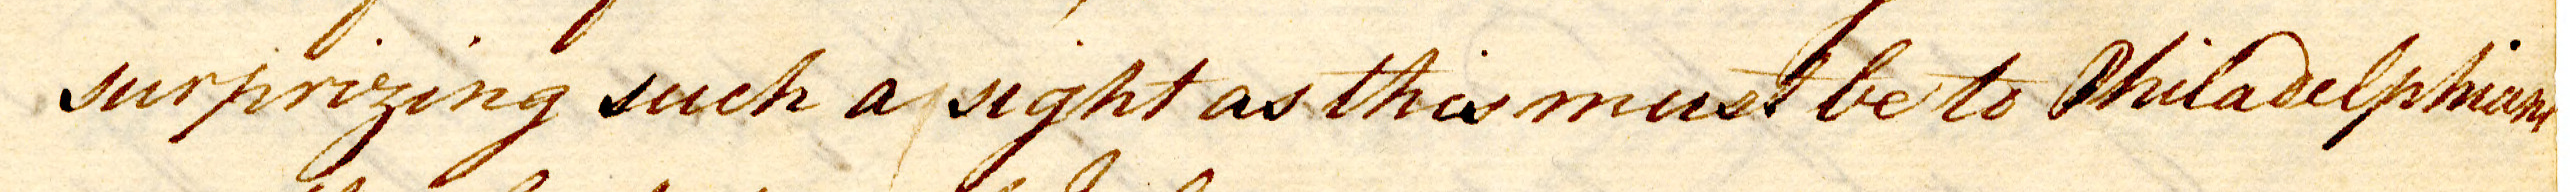surprizing such a sight as that must be to Philadelphians
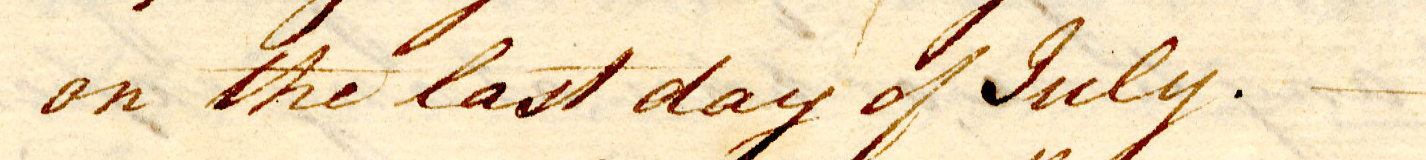on the last day of July.
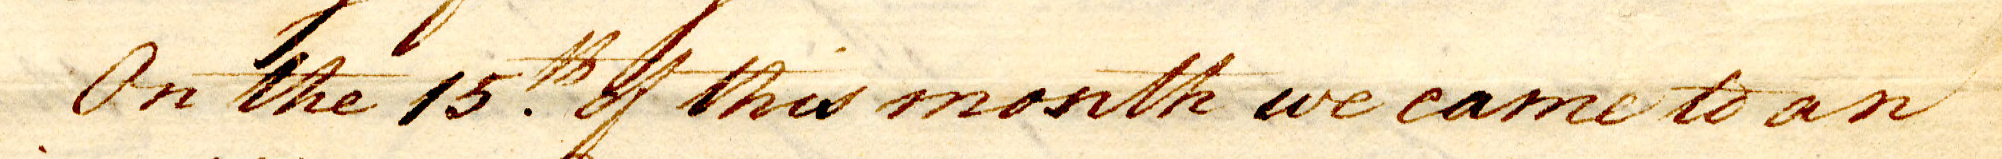On the 15^th. of this month we came to an
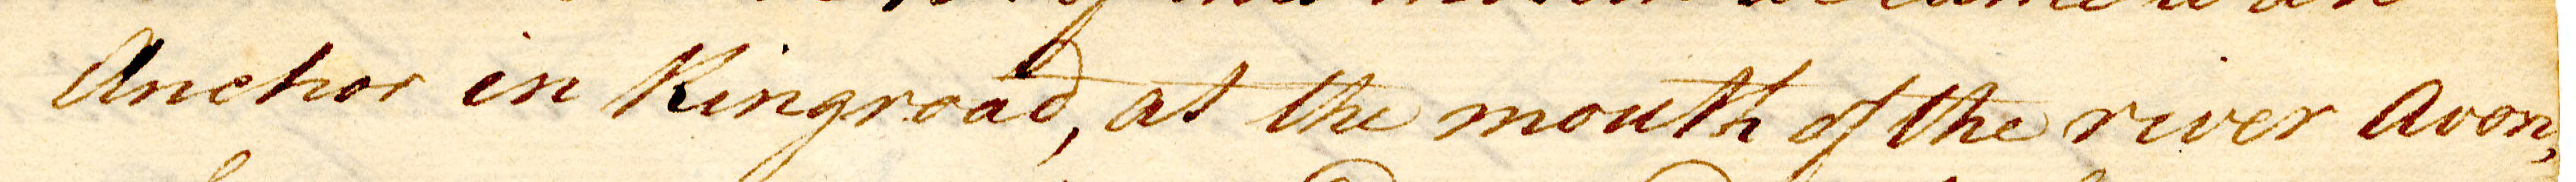Anchor in Kingroad, at the mouth of the river Avon,
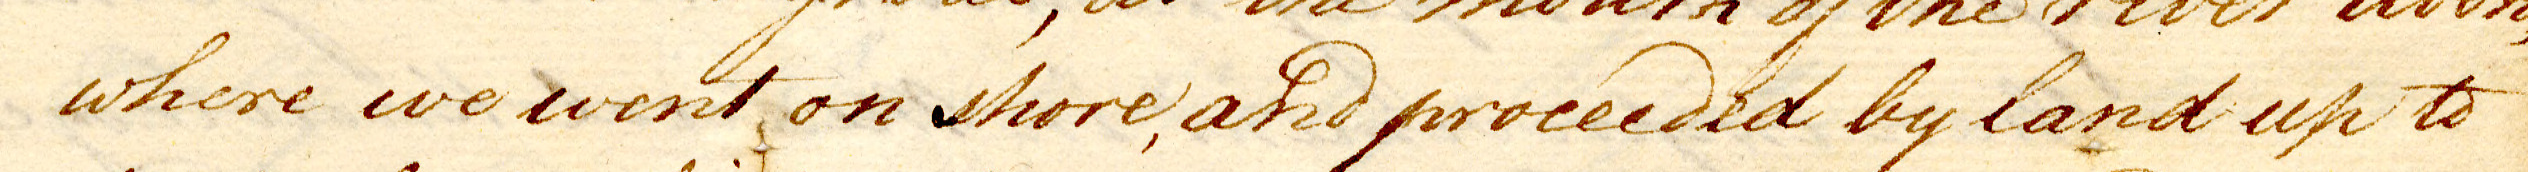where we went on shore, and proceeded by land up to
